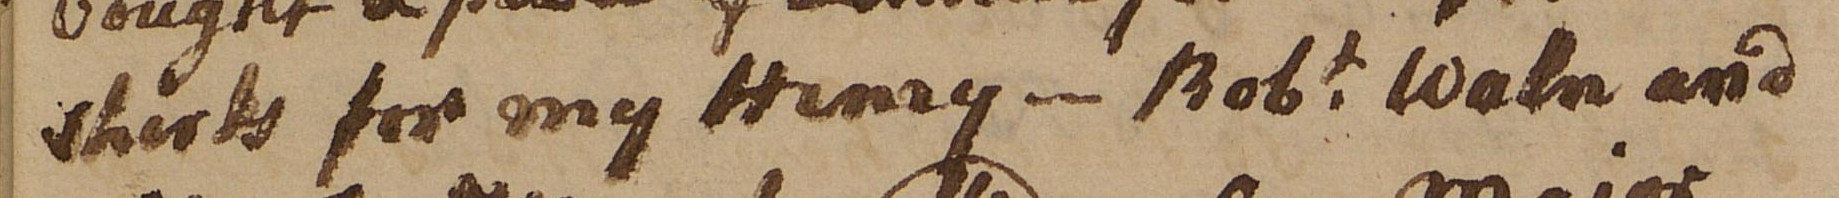shirts for my Henry- Rob^r. Waln and
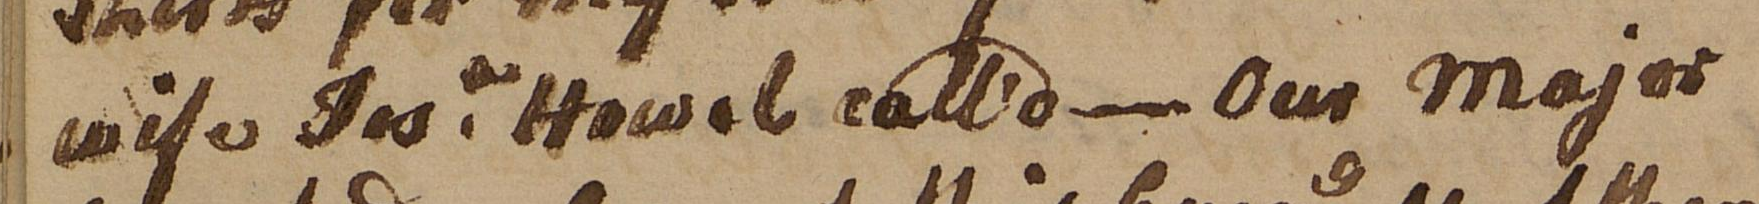wife Jos^a. Howel call'd- Our Major
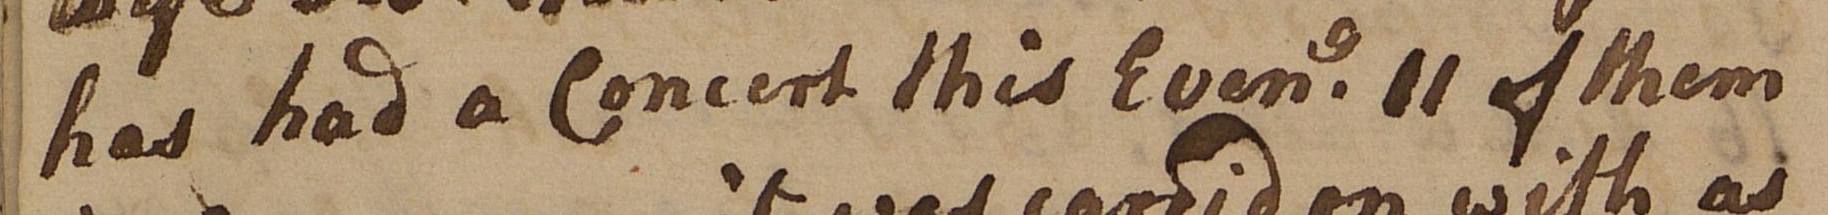has had a Concert this Even^g. 11 of them
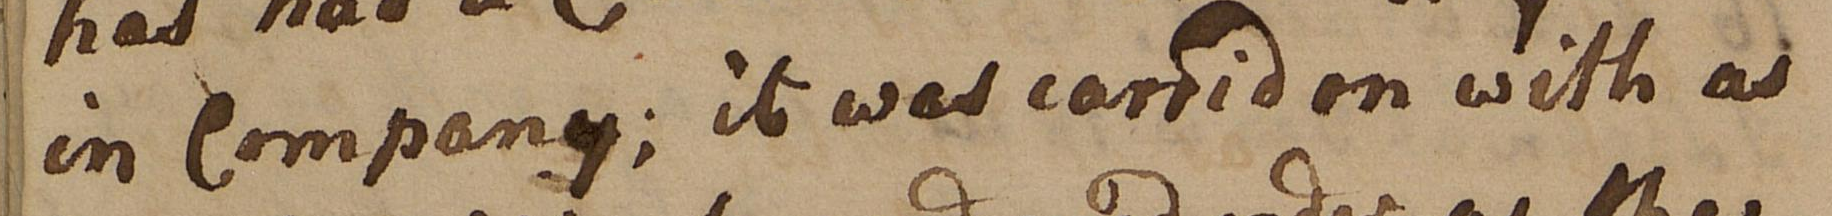in Company; it was carrid on with as
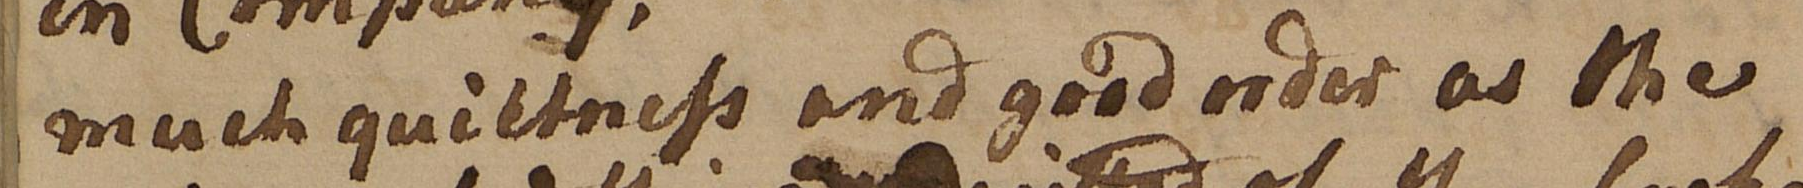much quickness and good order as the
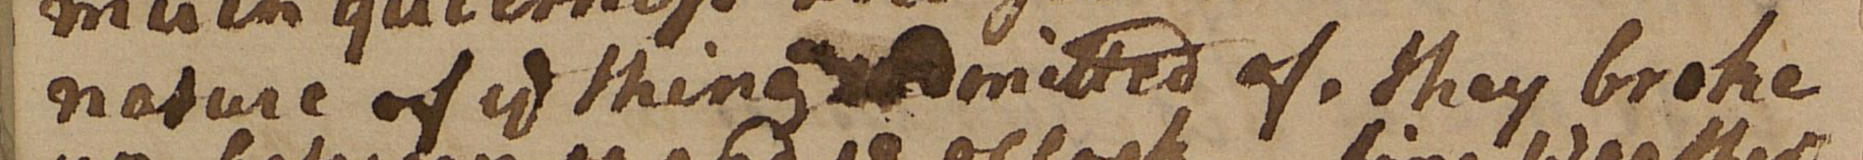nature of y^e thing admitted of. they broke
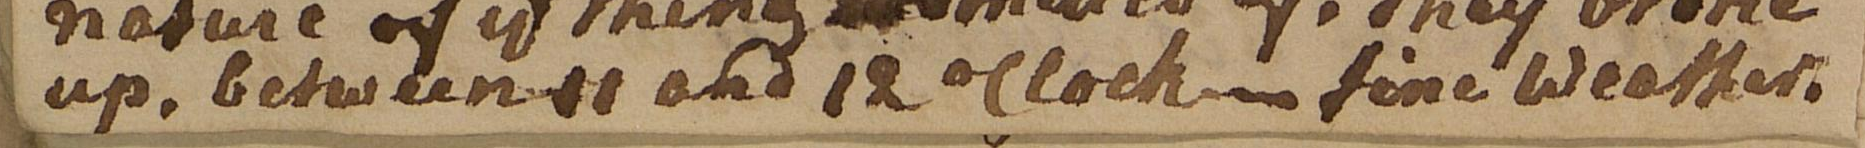up, between 11 and 12 ^o Clock- fine Weather.
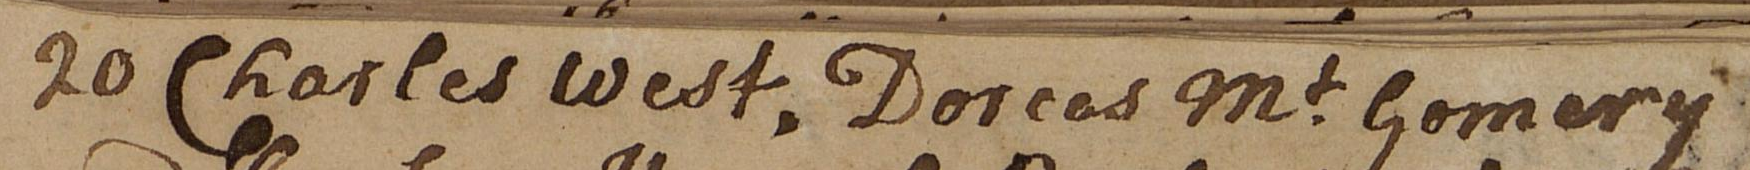20 Charles West, Dorcas M^t. Gomery
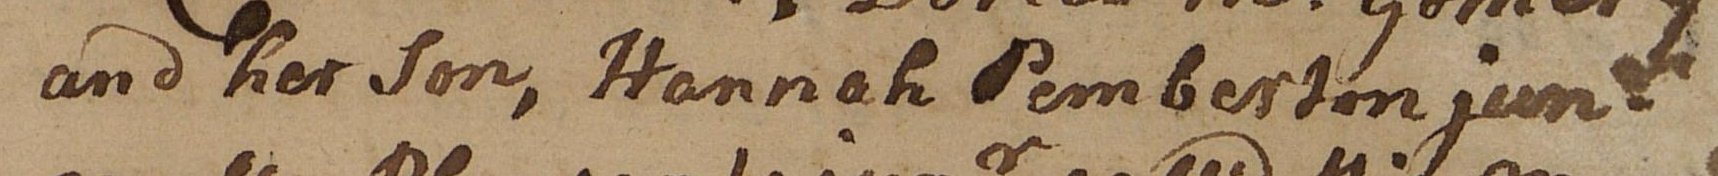and her Son, Hannah Pemberton jun^r.
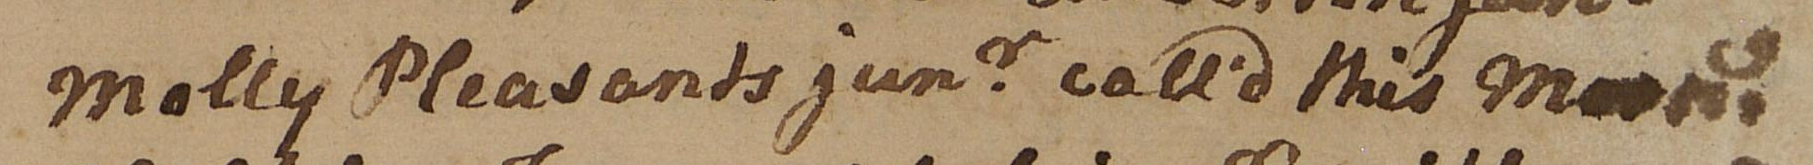Molly Pleasants jun^r. call'd this morn^g.
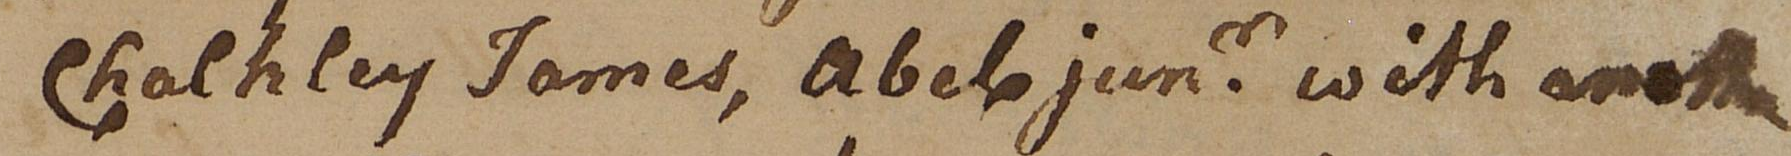Chalkley James, Abel jun^r. with another
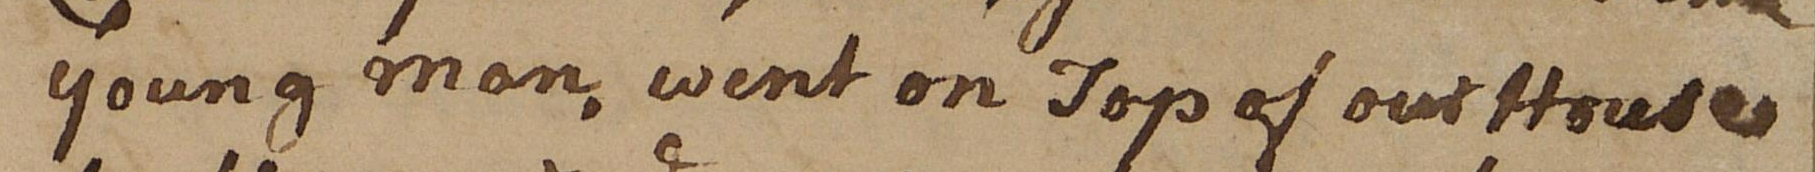young man, went on Top of our House
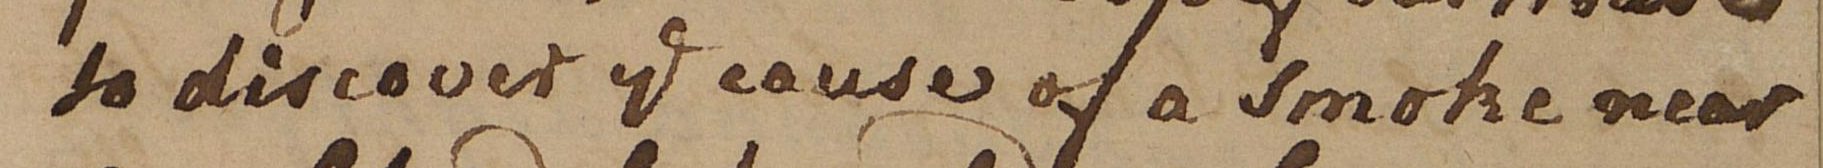to discover y^e cause of a smoke near
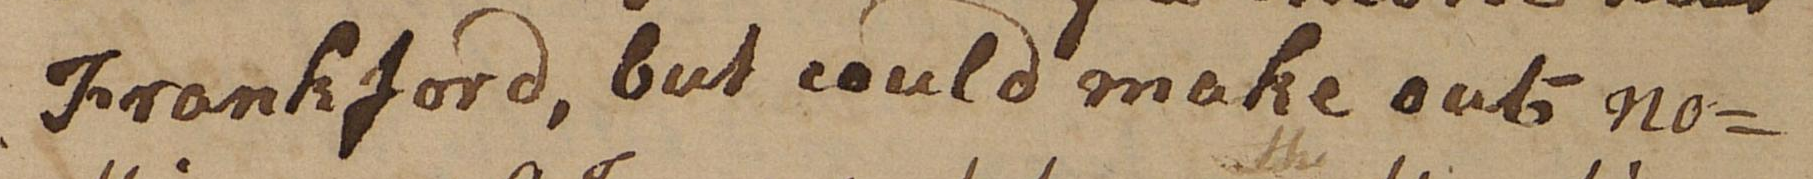Frankford, but could make out no-
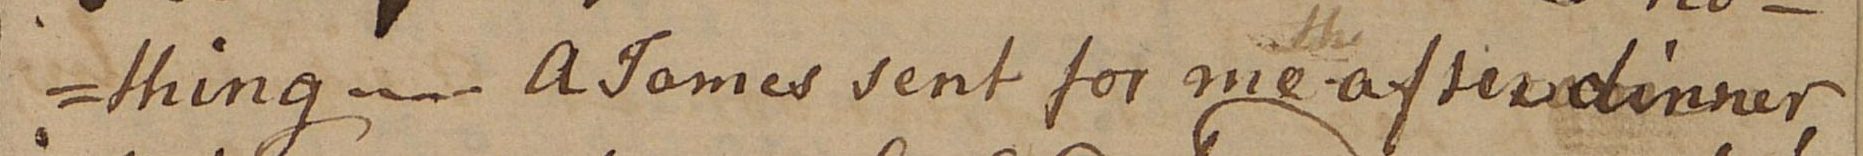-thing- A James sent for me after dinner,
